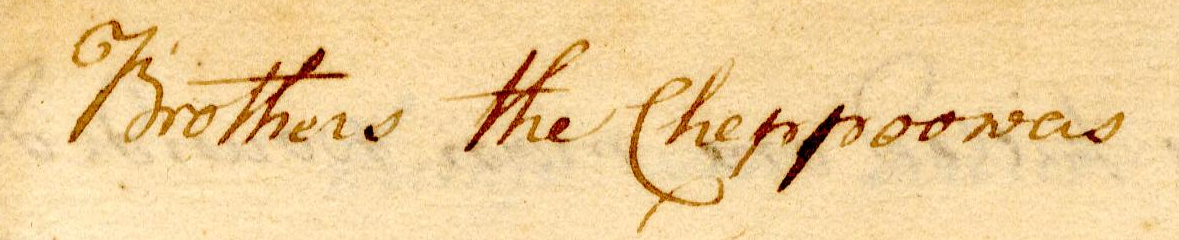Brothers the Cheppoowas
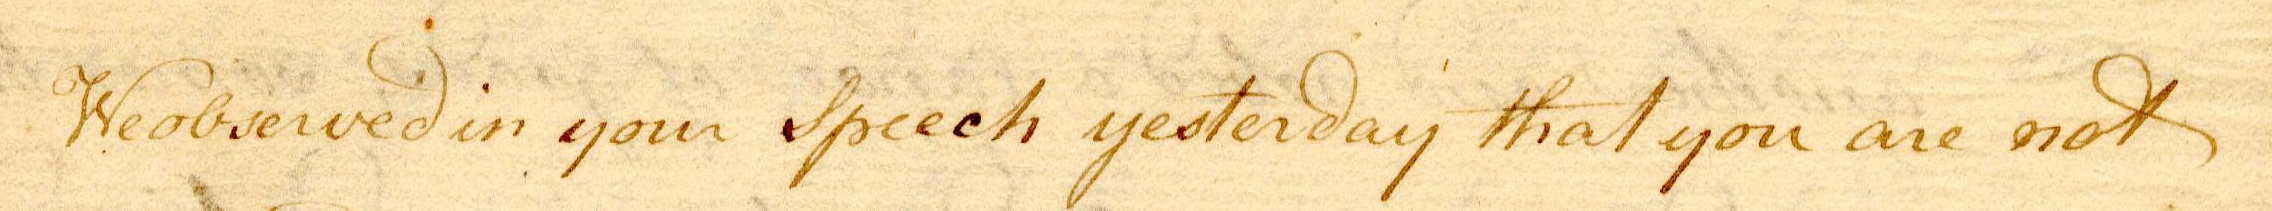We observed in your Speech yesterday that you are not
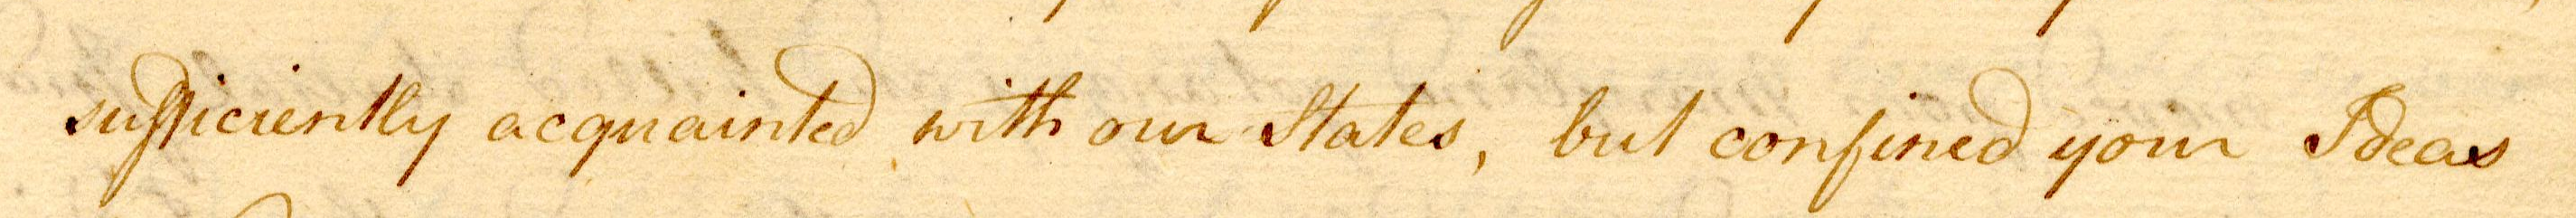sufficiently acquainted with our States, but confined your Ideas
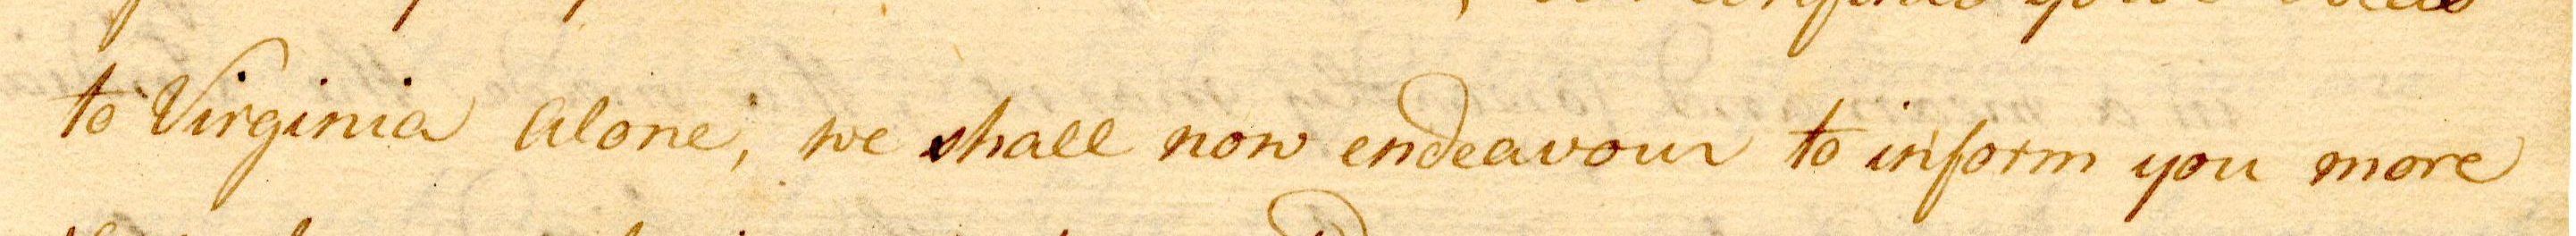to Virginia alone; we shall now endeavour to inform you more
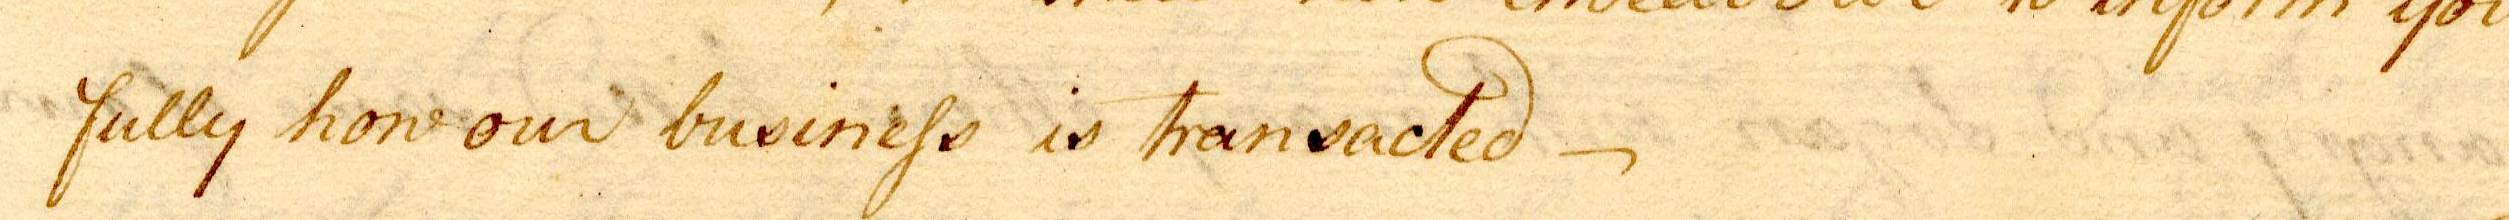fully how our business is transacted-
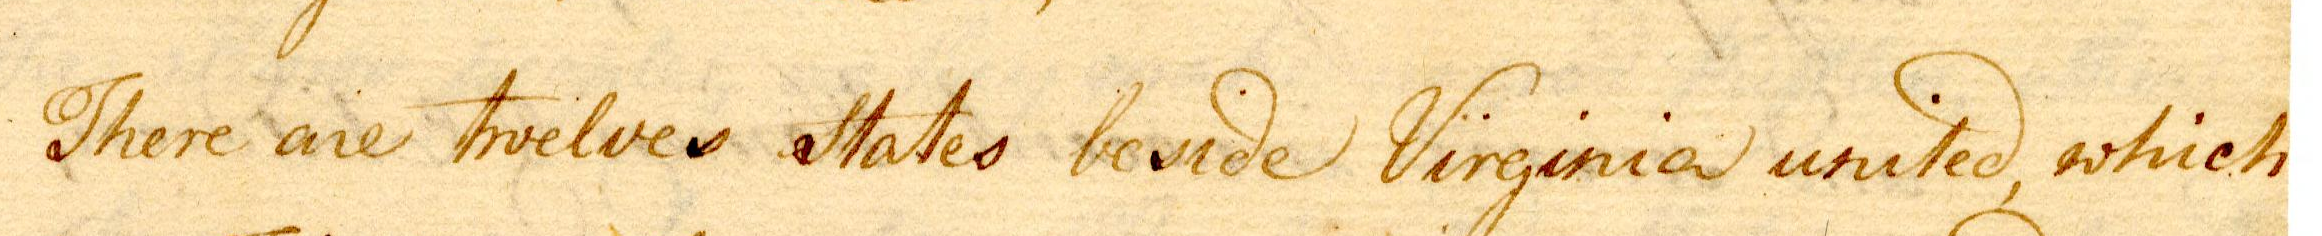There are twelves States beside Virginia united, which
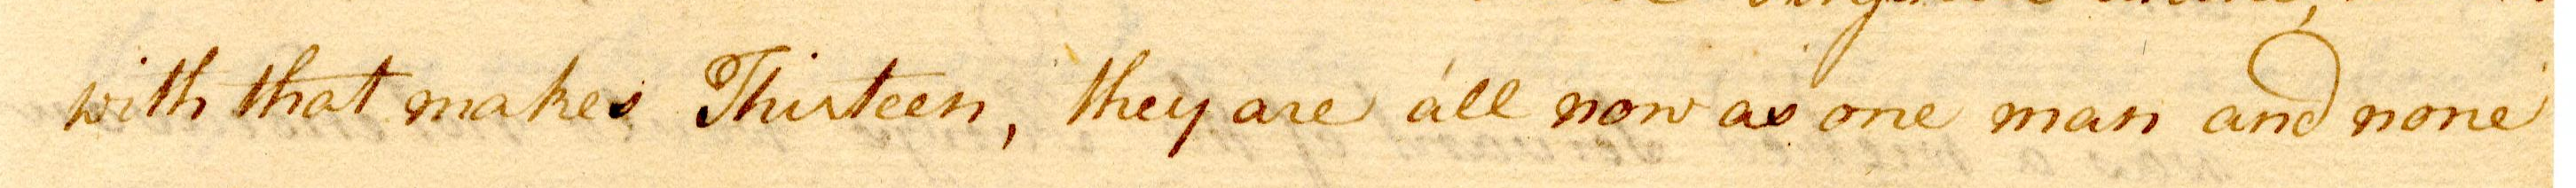with that makes Thirteen, they are all now as one man and none
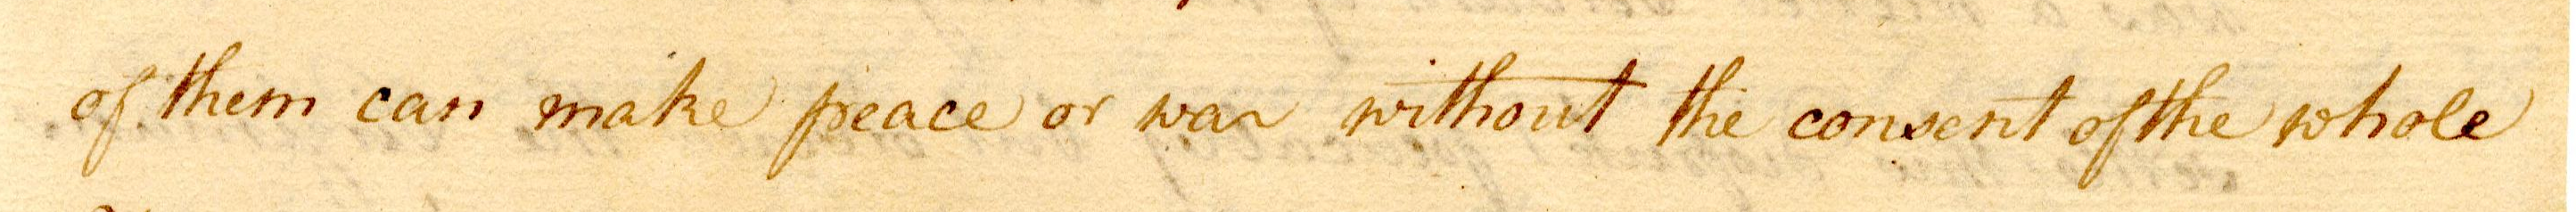of them can make peace or war without the consent of the whole
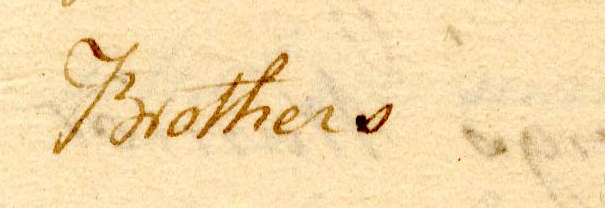Brothers
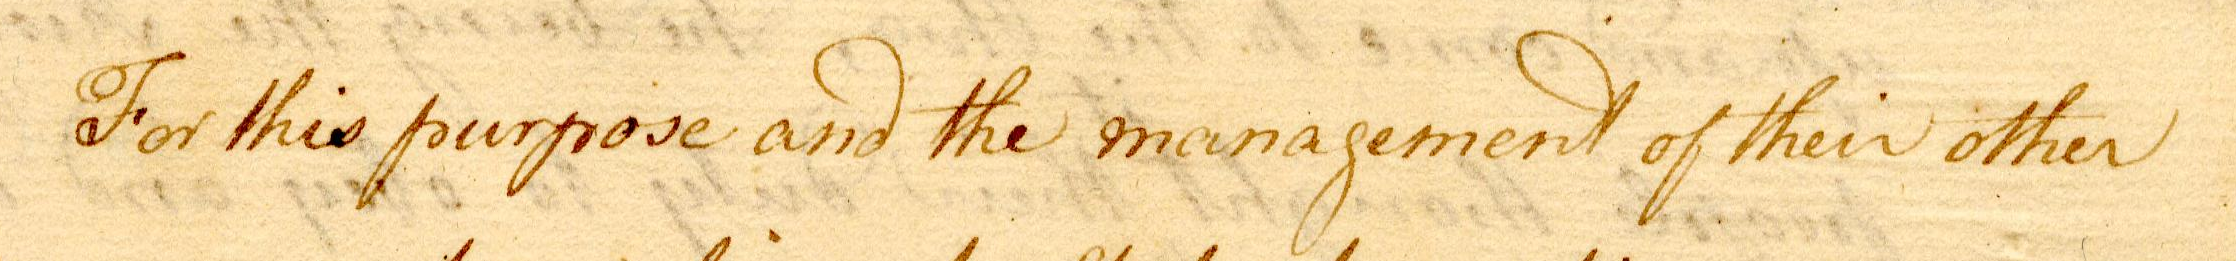For this purpose and the management of their other
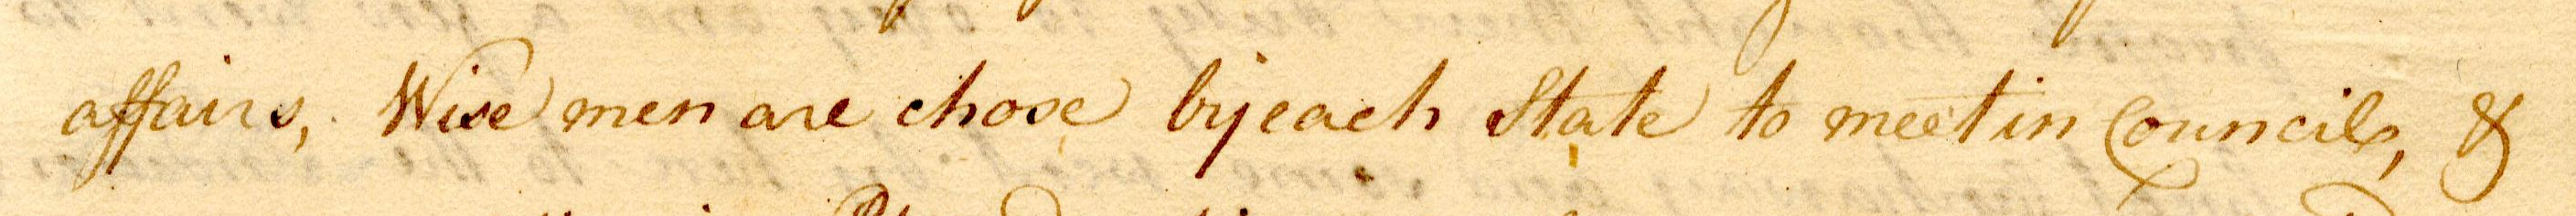affairs, Wise men are chose by each State to meet in Councils, &
